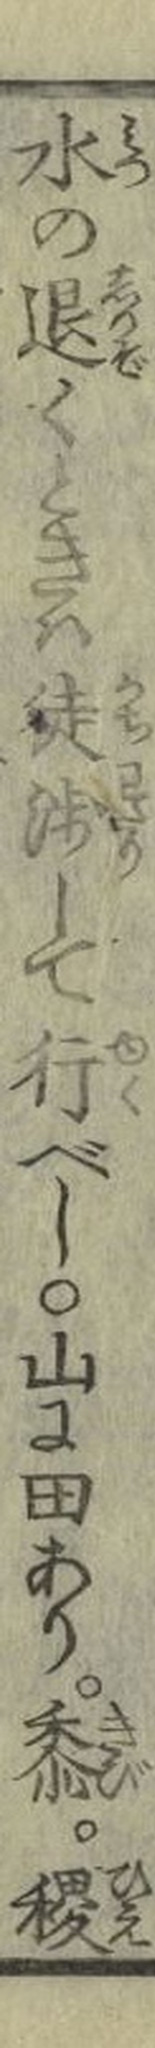水の退くときは徒渉して行べし○山に田あり。黍。稗
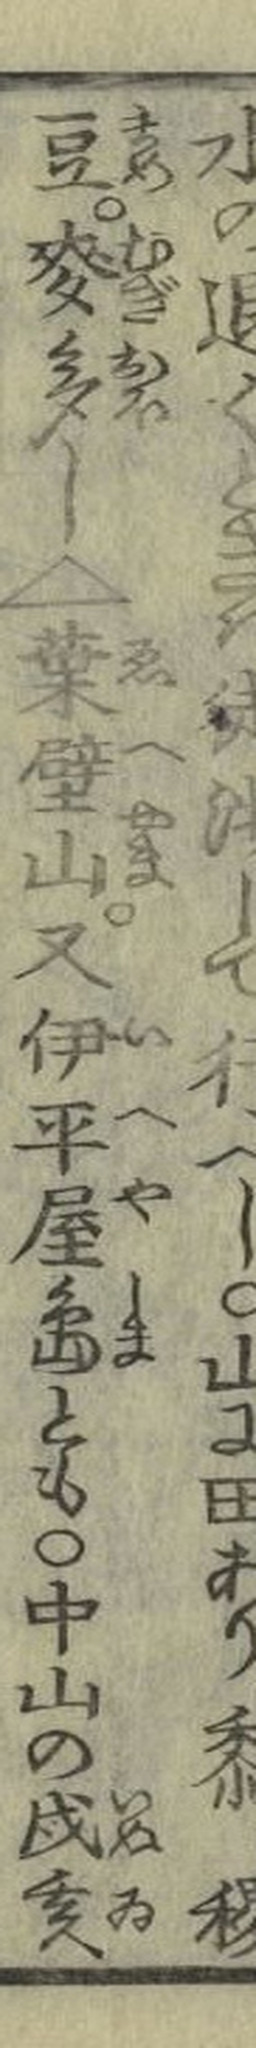豆。麦多し△葉壁山。又伊平屋島とも○中山の戌亥
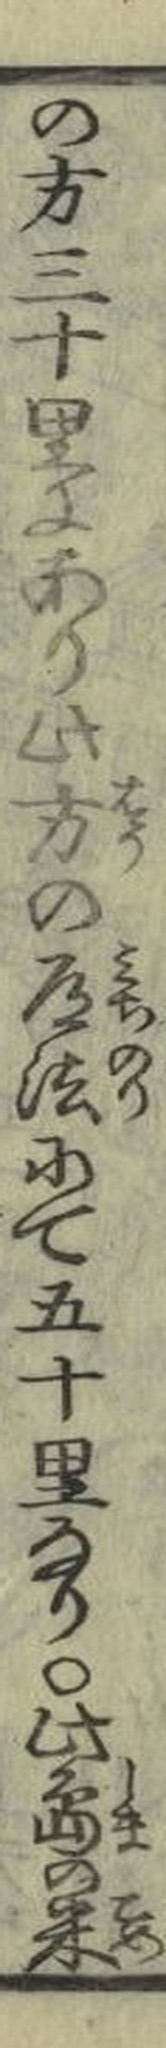の方三十里にあり此方の道法にて五十里なり○此島の米
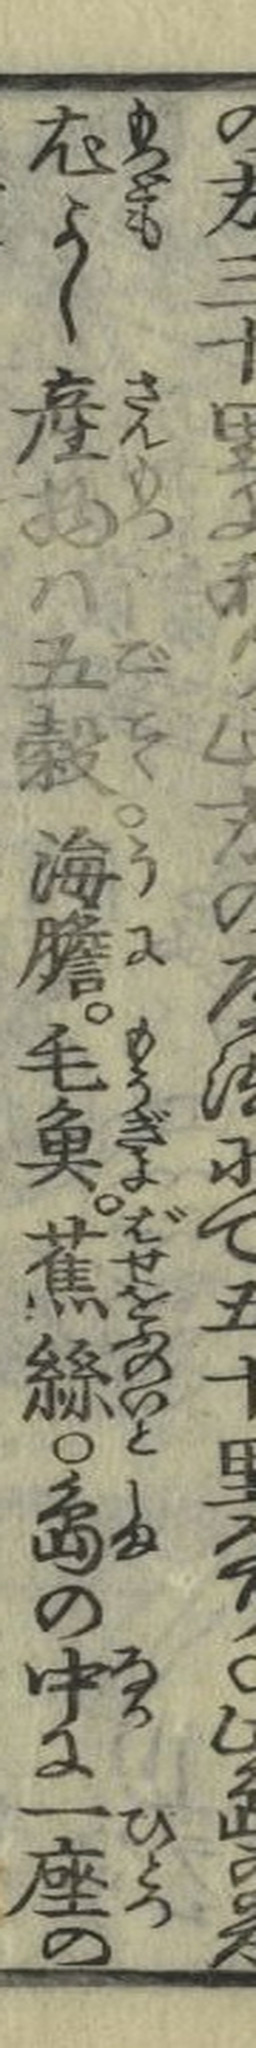尤よし産物は五穀。海胆。毛魚。蕉糸。島の中に一座の
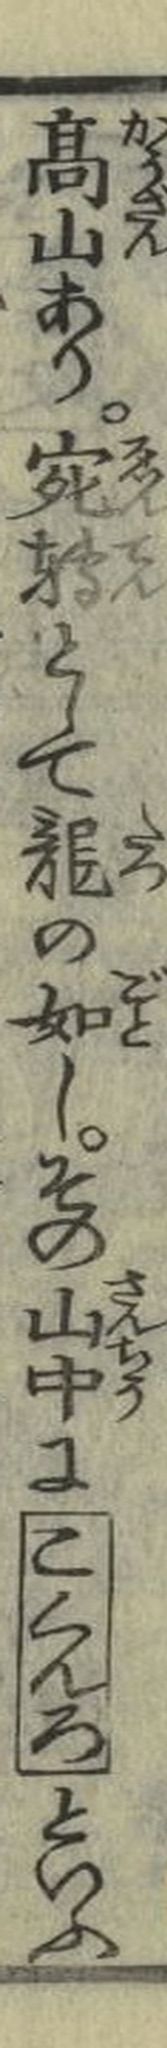高山あり。宛転として竜の如し。その山中に「こくんろ」といふ
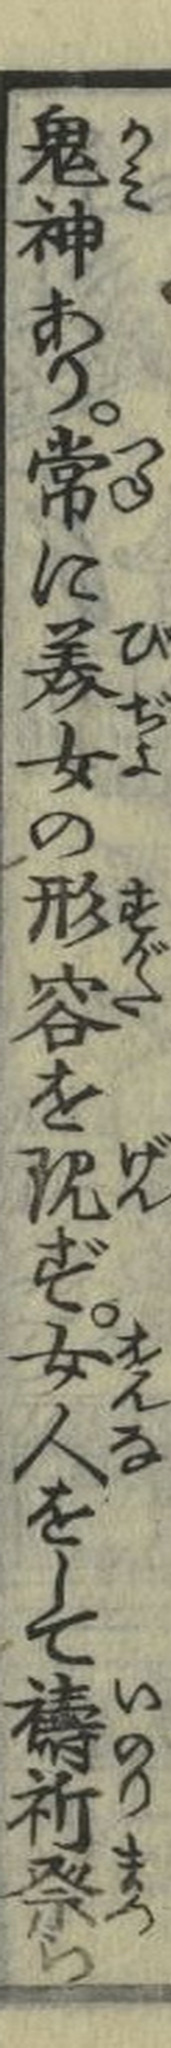鬼神あり。常に美女の形容を現ず。女人をして祷祈祭ら
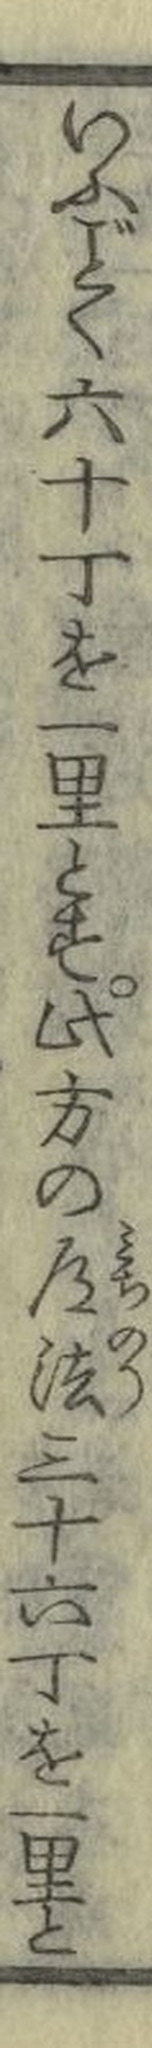いふごとく六十丁を一里とす。此方の道法三十六丁を一里と
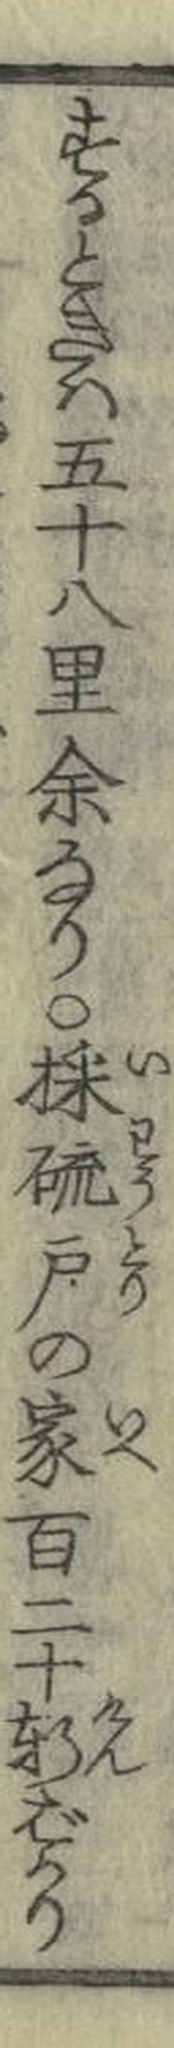するときは五十八里なり○採硫戸の家百二十軒ばかり
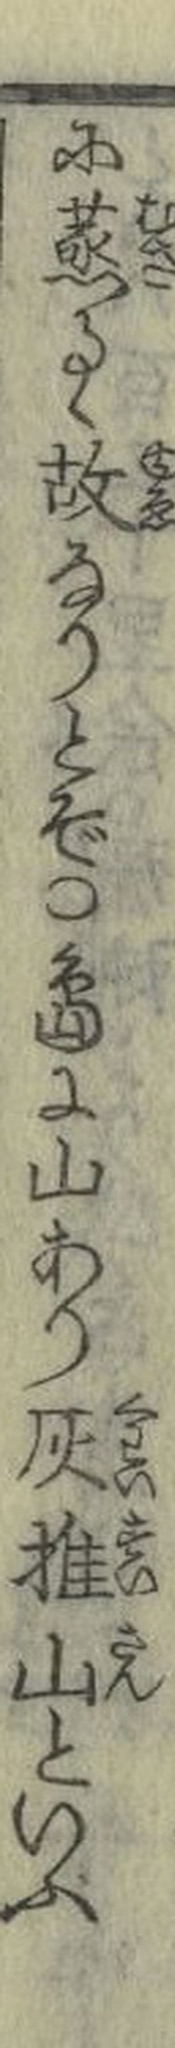に蒸るゝ故なりとぞ○島に山あり灰推山といふ

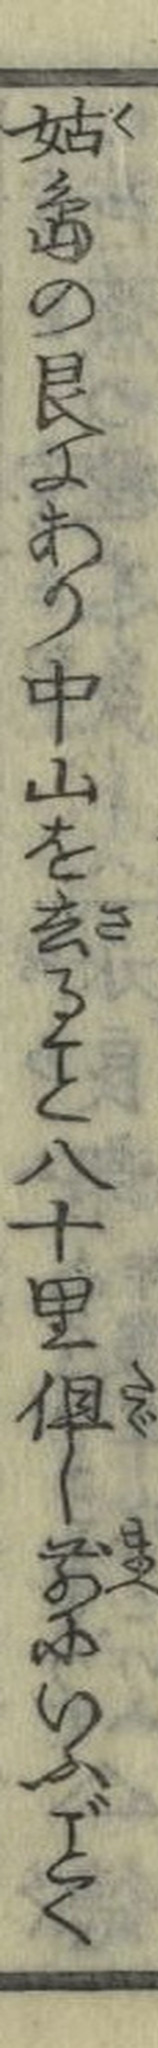姑島の艮にあり中山を去ること八十里但し前にいふごとく
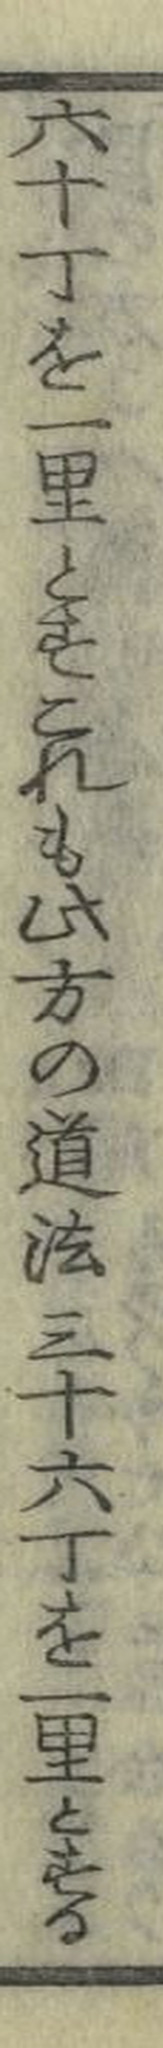六十丁を一里とすこれも此方の道法三十六丁を一里とする
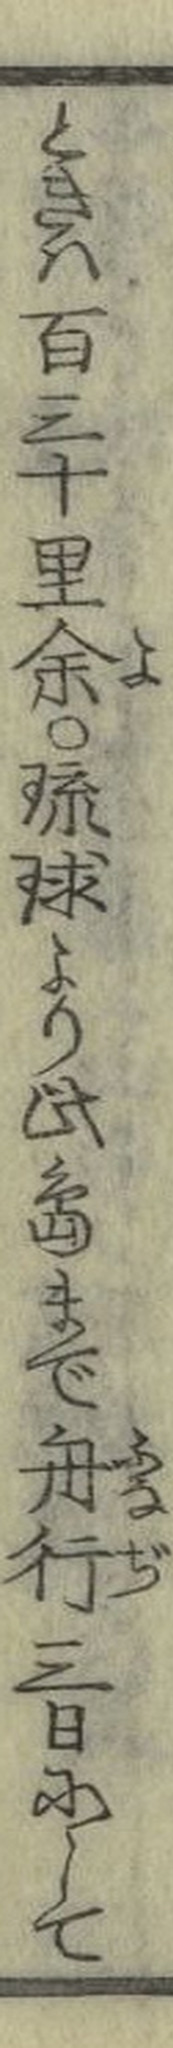ときは百三十余○琉球より此島まで舟行三日にして
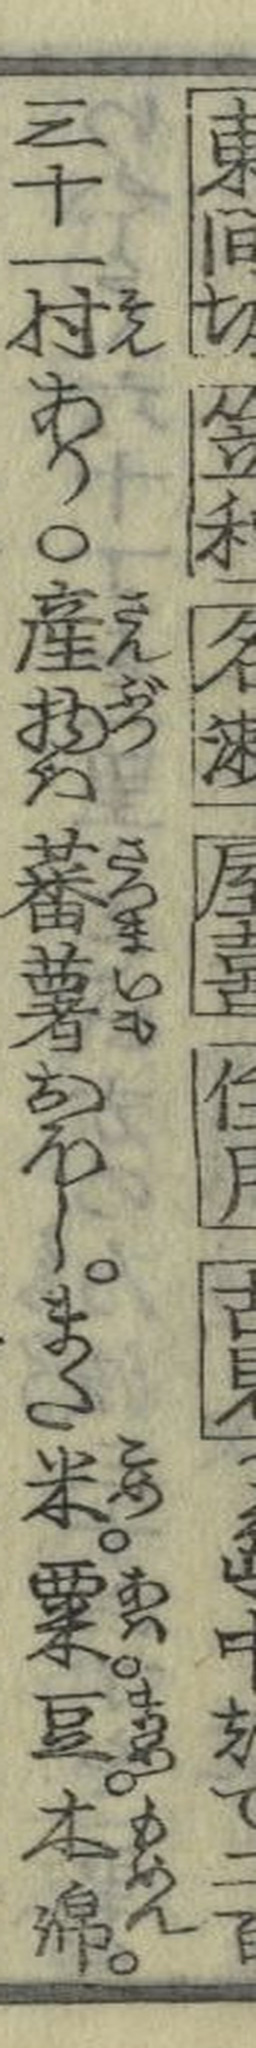三十一村あり○産物は蕃薯おほし。また米。粟。豆。木綿。

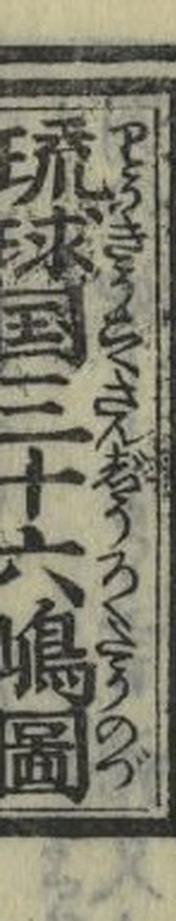琉球国三十六嶋図
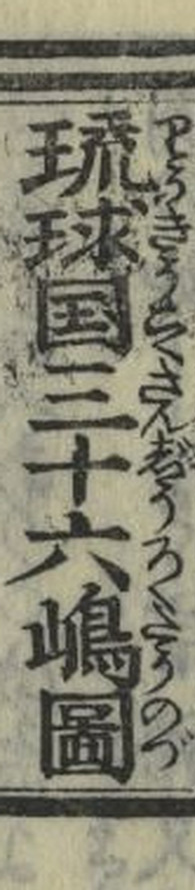琉球国三十六嶋図

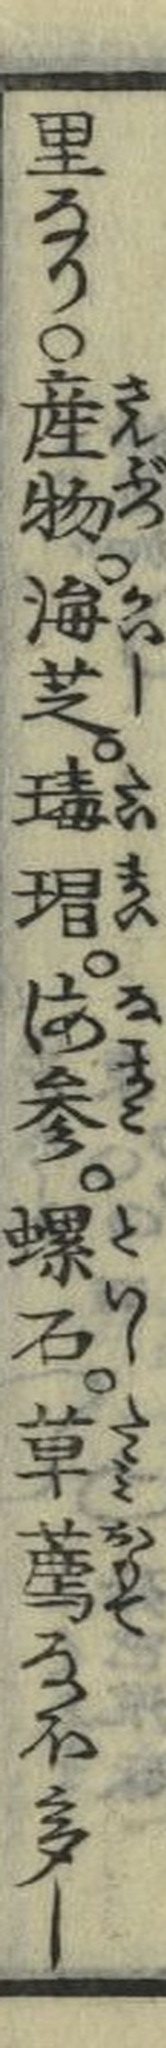里なり○産物。海芝。玳瑁。海参。螺石。草薦なほ多し
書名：琉球奇譚
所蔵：University of the Ryukyus Library
